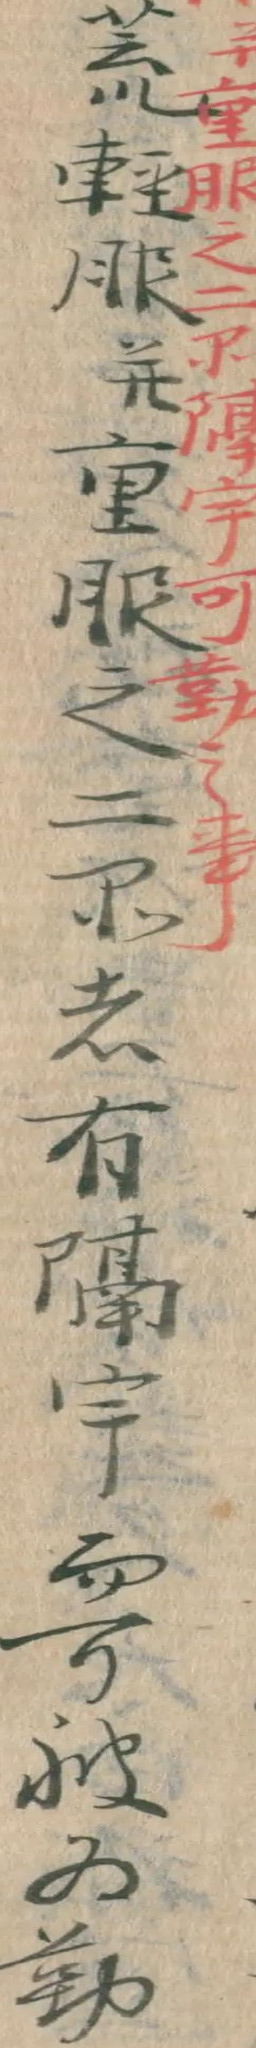荒軽服并重服之二品者有隔宇而可被為勤
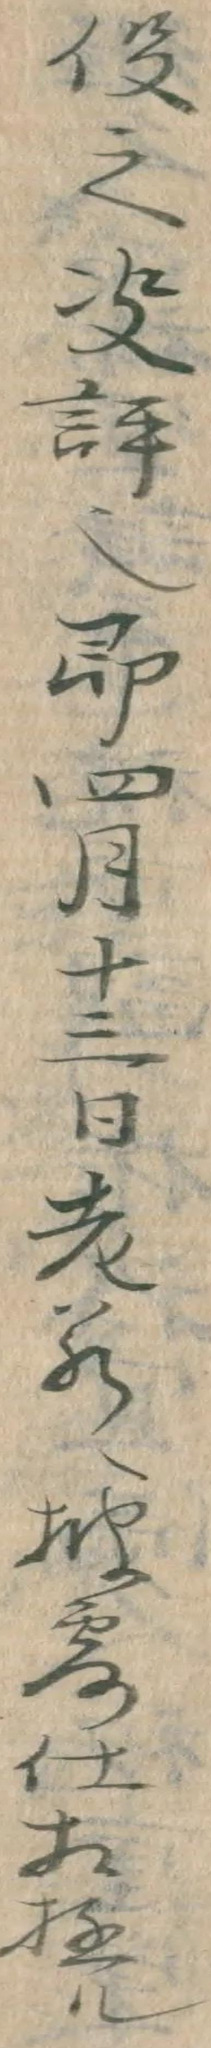役之決評也即四月十三日老若へ披露仕相極ル
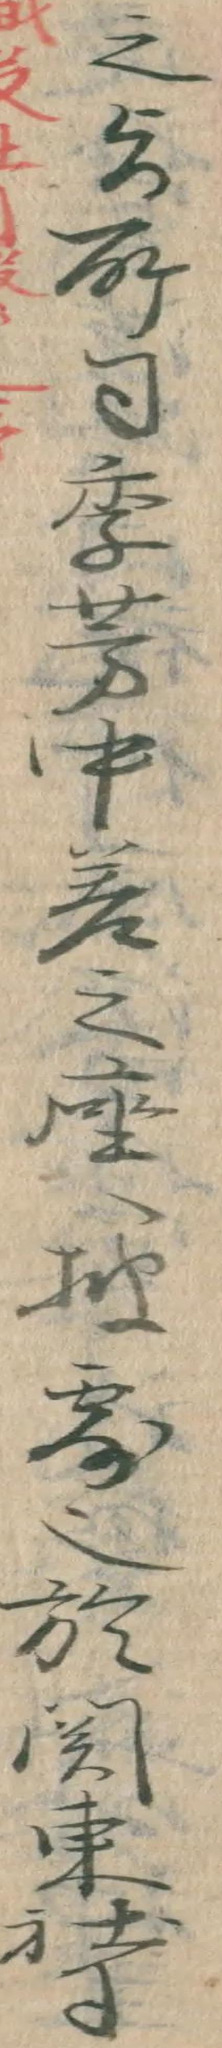之旨所司季芳中差之座へ披露也於関東社司
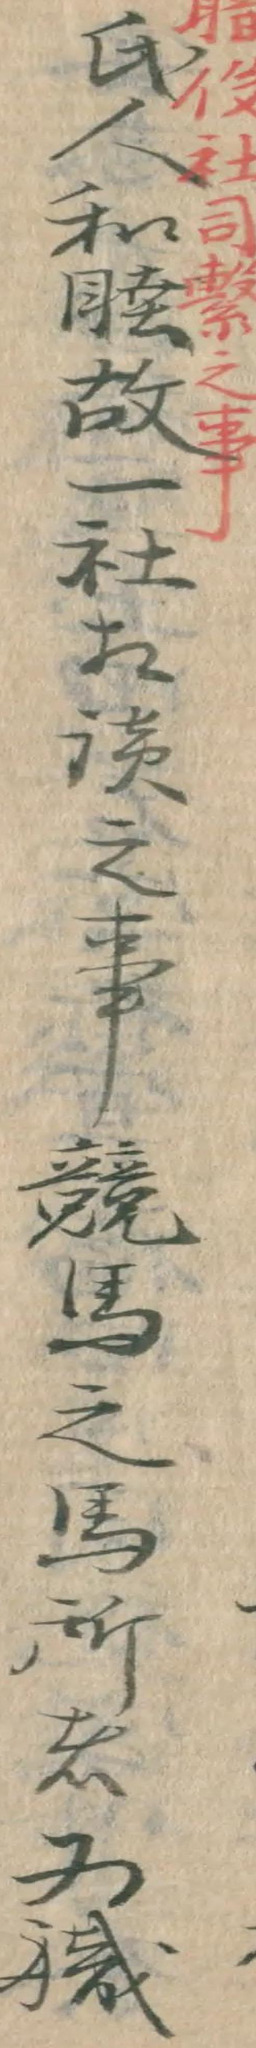氏人和睦故一社相談之事競馬之馬所者為職
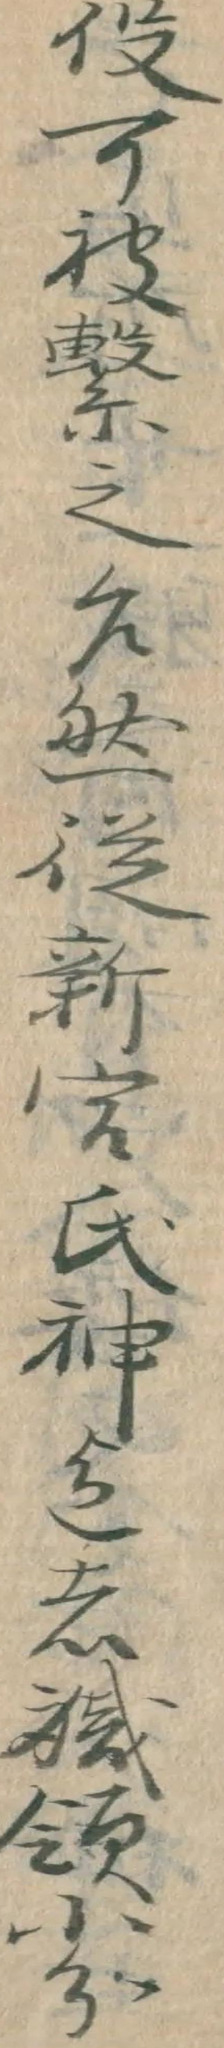役可被繋之乍然従新宮氏神迄者職領小分
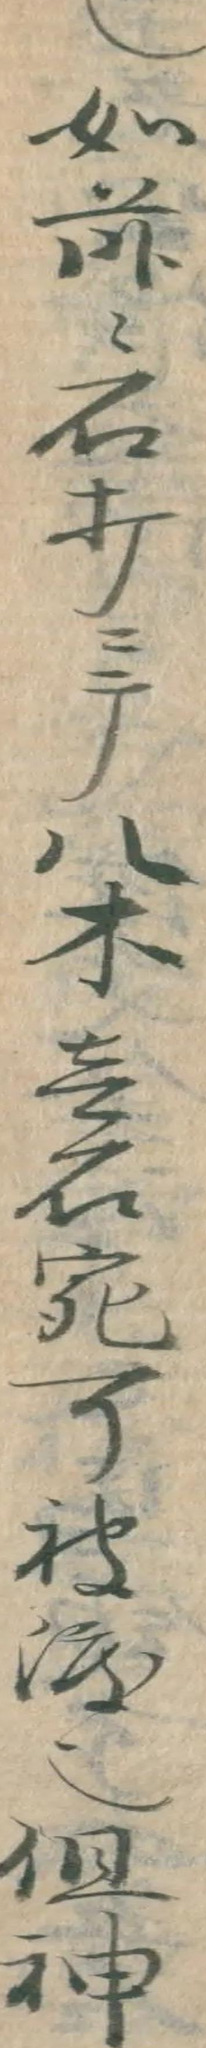也如前々石打ニテ八木壱石宛可被渡也但神

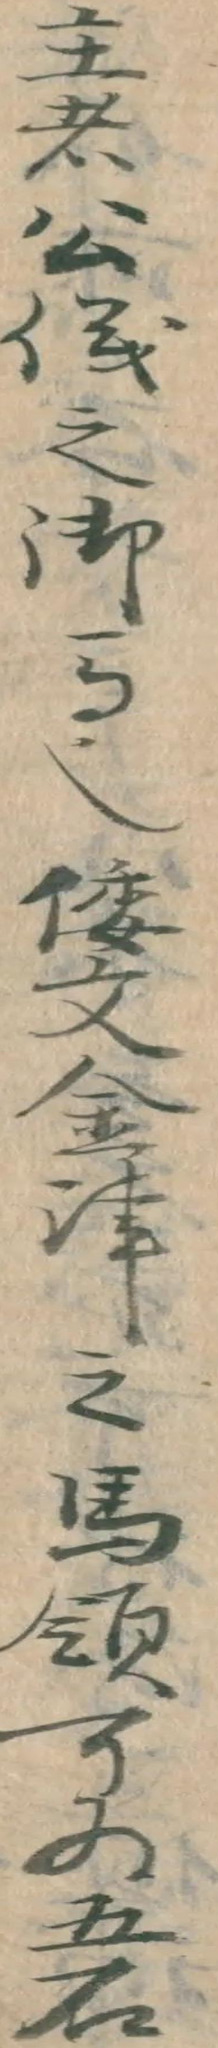主者公儀之御馬也倭文金津之馬領可為五石
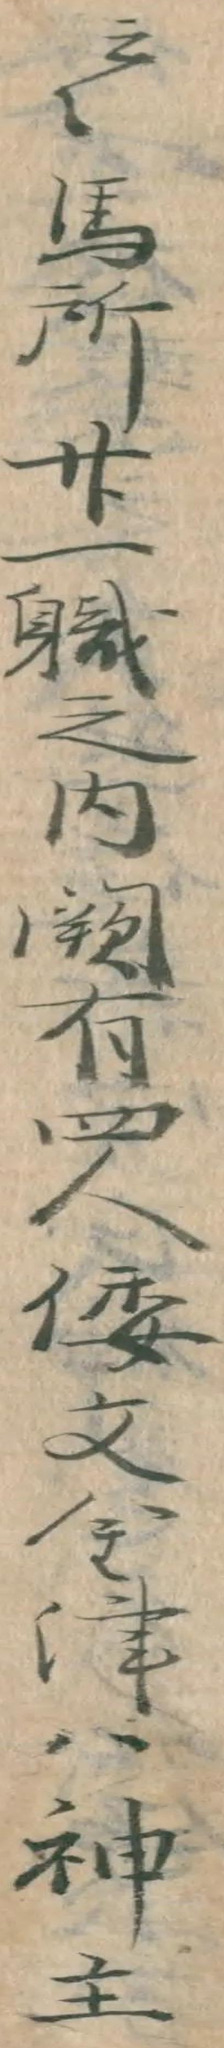云々馬所廿一職之内闕有四人倭文金津ハ神主
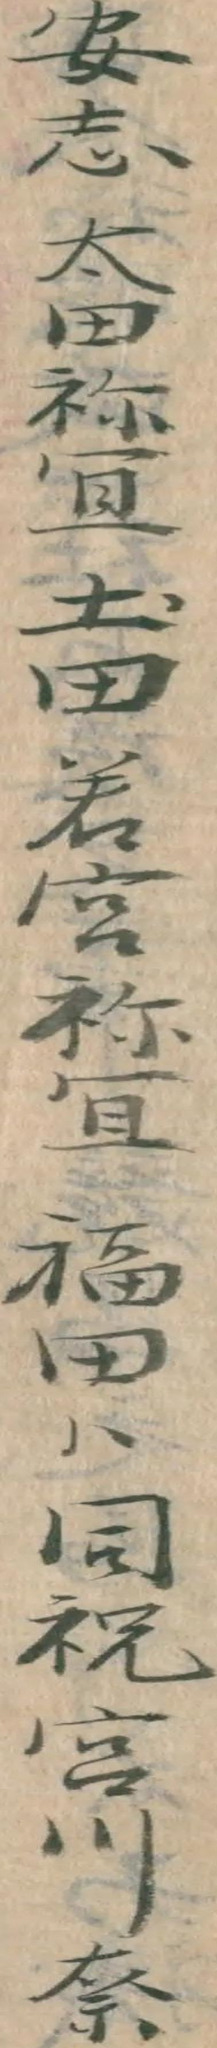安志太田祢宜土田若宮祢宜福田ハ同祝宮川奈
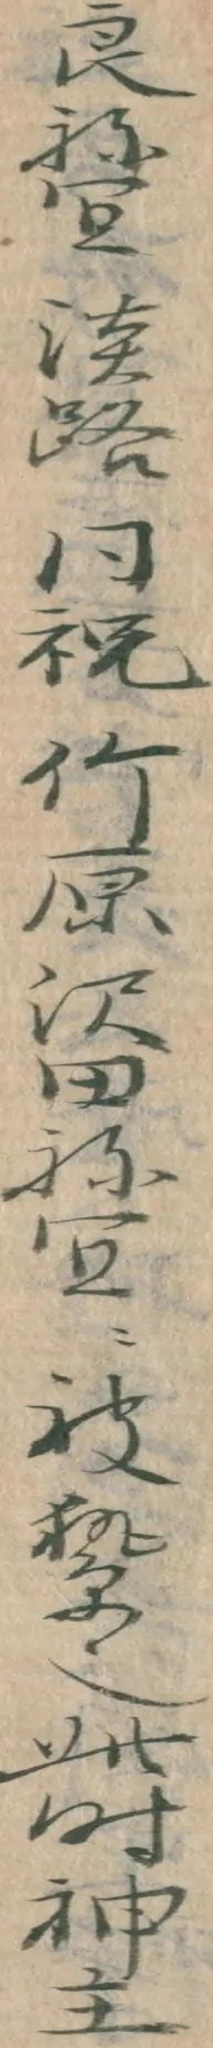良祢宜淡路同祝竹原沢田祢宜ニ被縶也此時神主
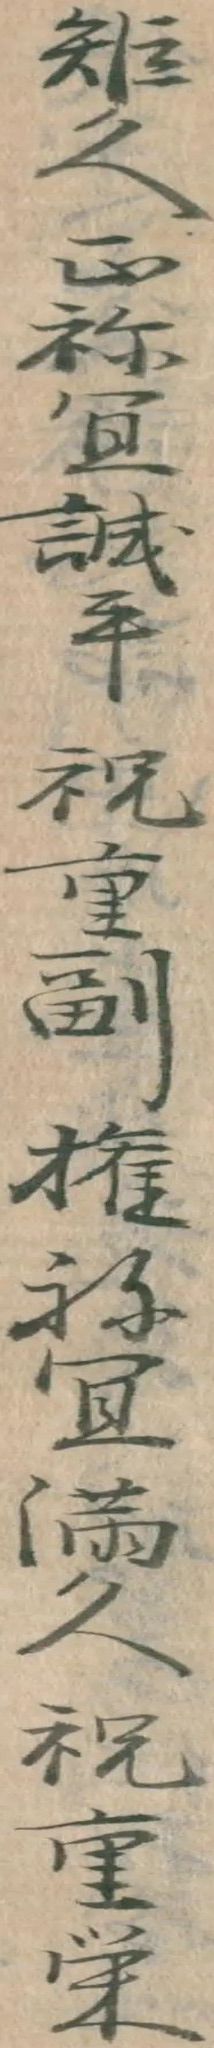矩久正祢宜誠平祝重副権祢宜満久祝重栄
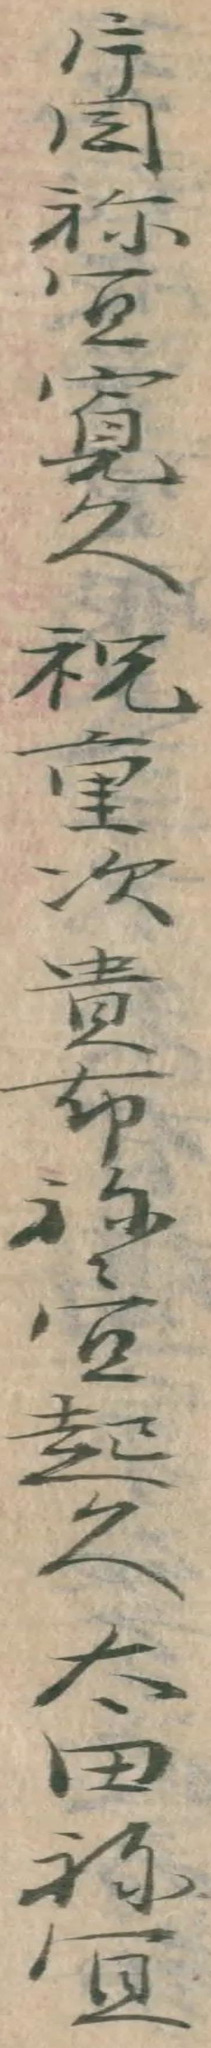片岡祢宜寛久祝重次貴ふね々宜起久太田祢宜
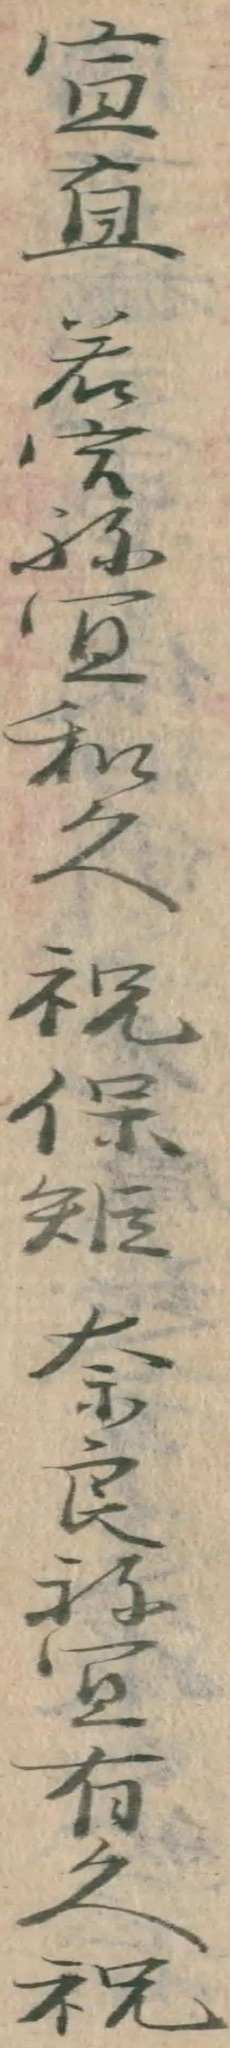宣直若宮祢宜和久祝保矩奈良祢宜有久祝
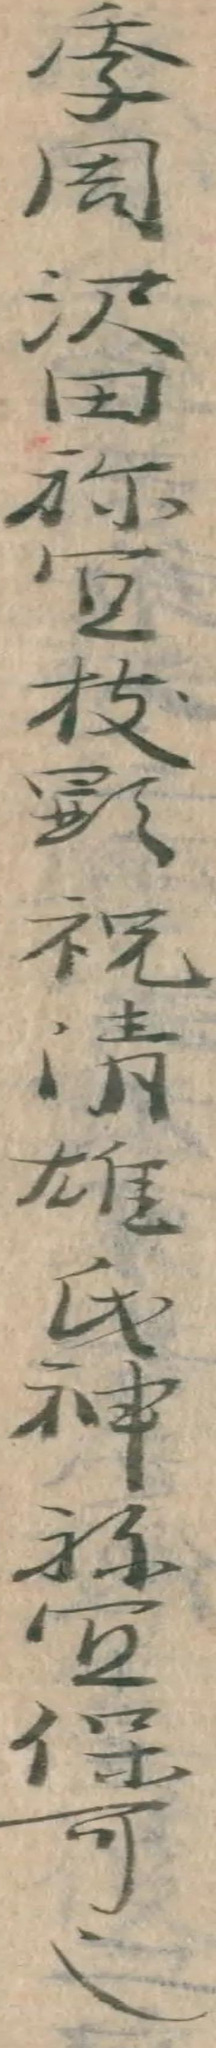季周沢田祢宜枝顕祝清雄氏神祢宜保可也
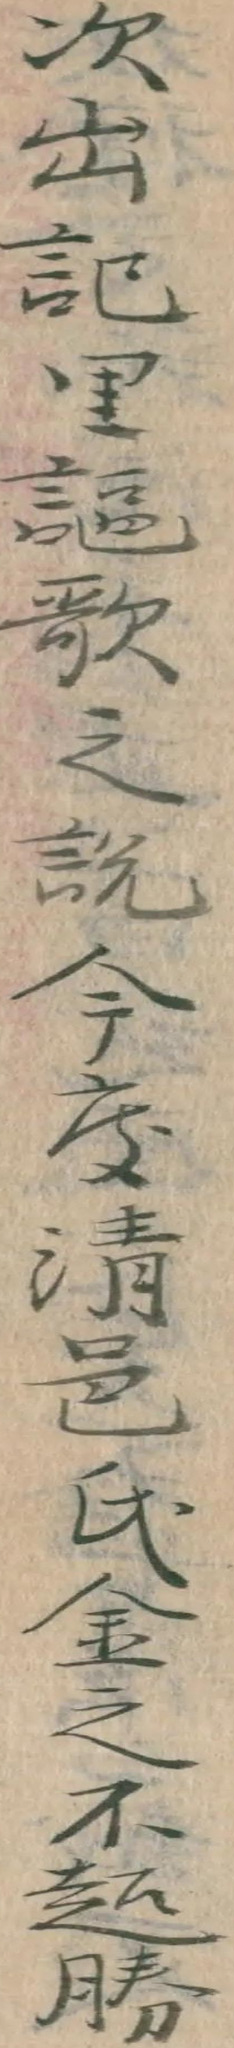次出記里謳歌之説今度清邑氏金之不趣勝
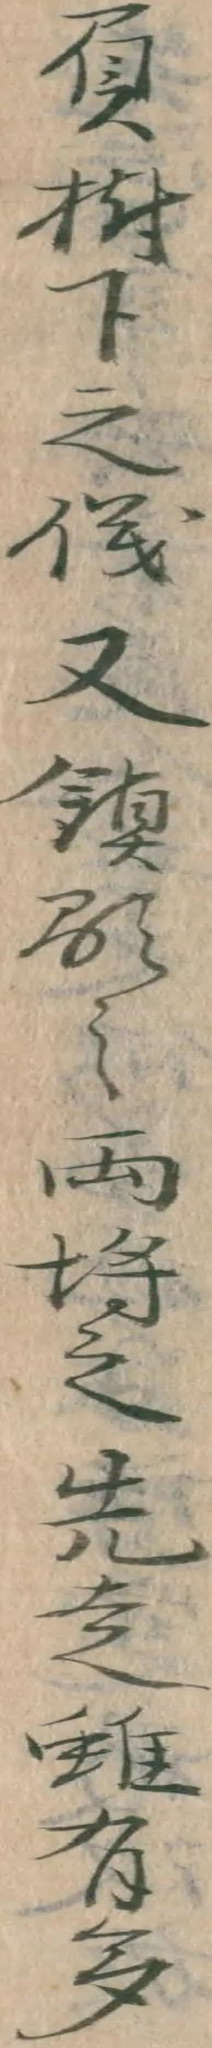負樹下之儀又鎮顕之両埒之先走雖有多
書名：賀茂社記録. 第10冊
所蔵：国立国会図書館 National Diet Library, JAPAN
